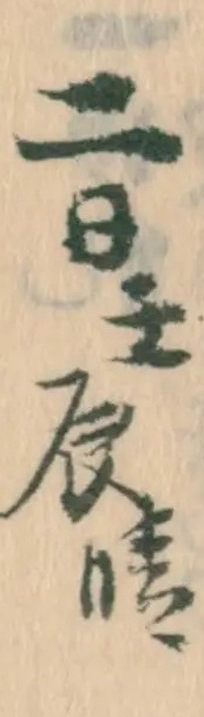二日壬辰晴
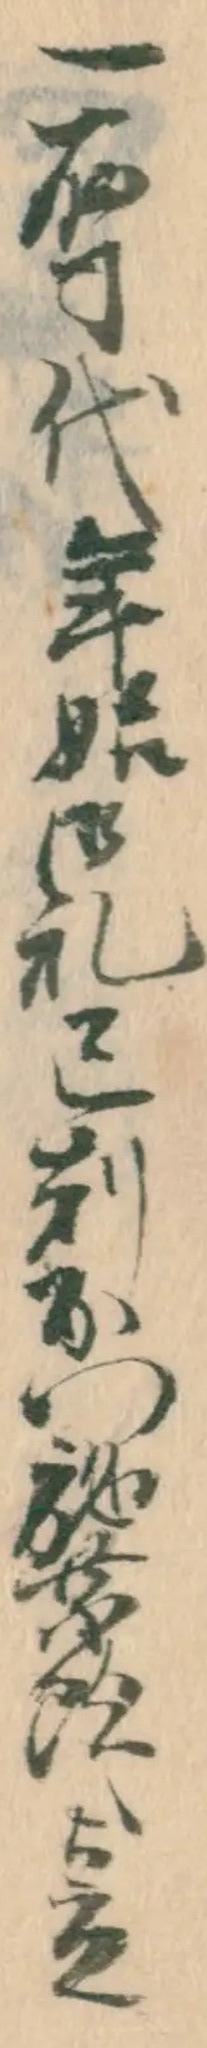一所司代年始御礼巳刻出門施薬院へ被立
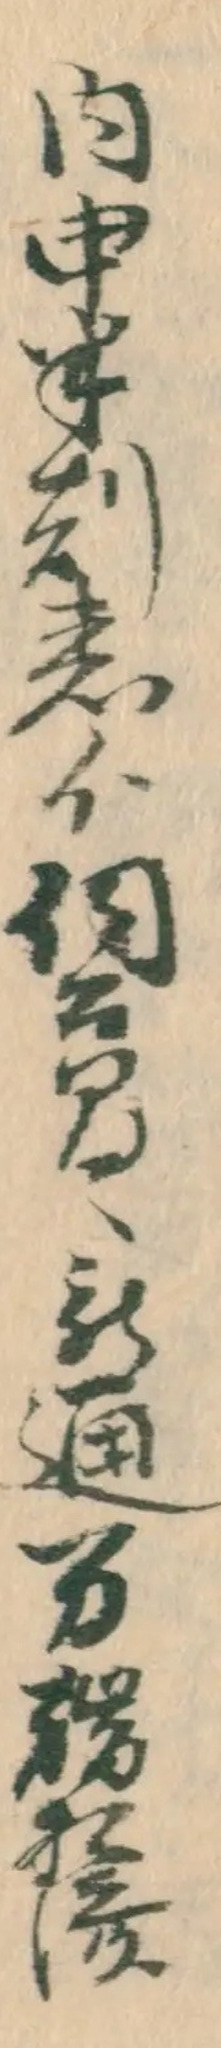内申半刻表ゟ伺公間へ被通万端相済
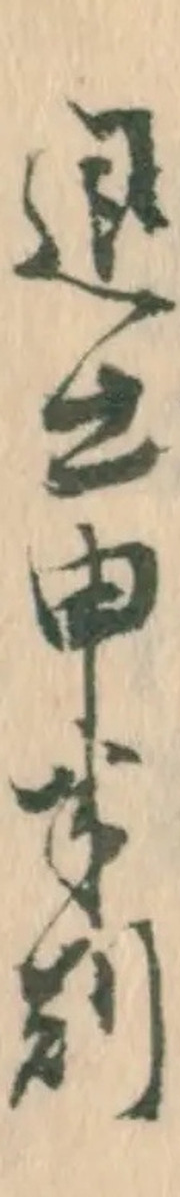退出申半刻
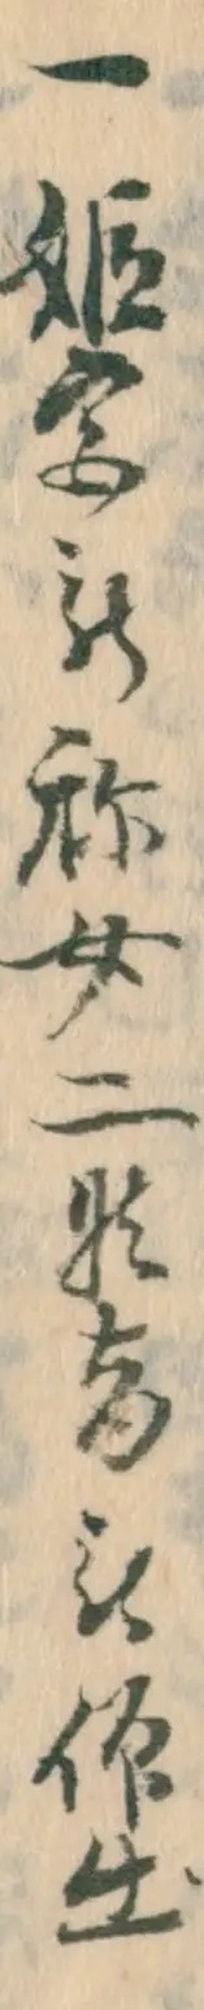一姫宮被称女二の宮被仰出
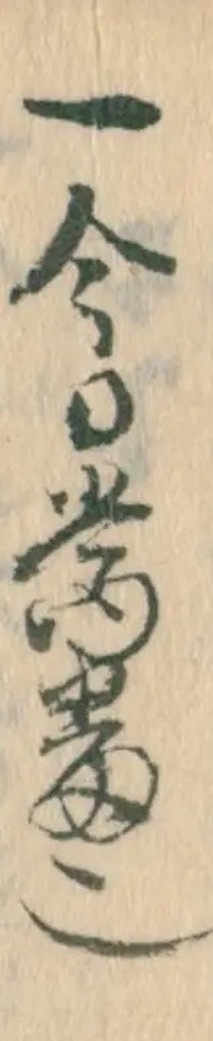一今日当番也
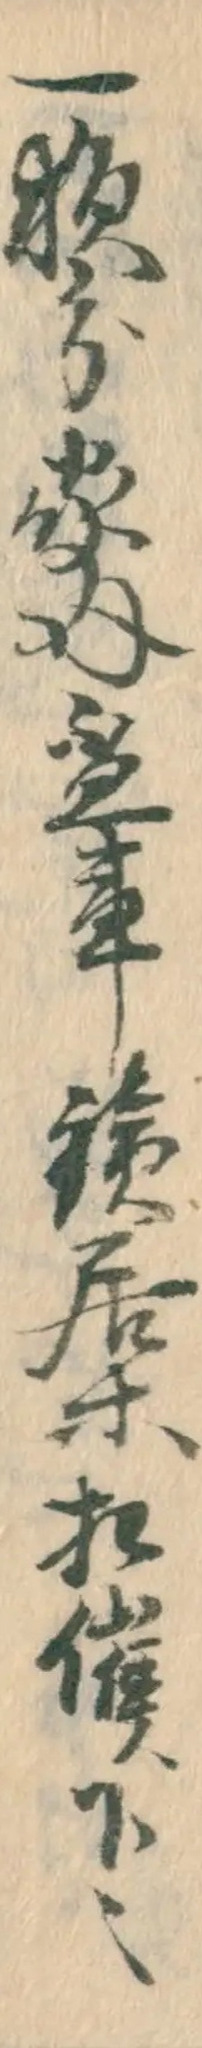一夜分家内盃事積居等相催ス下々

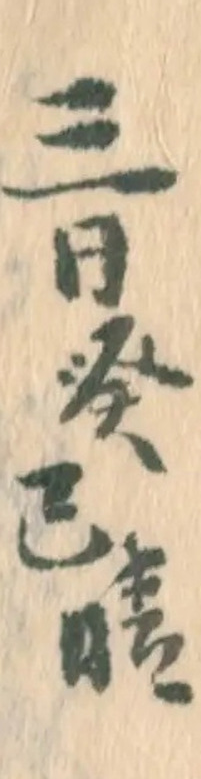三日癸巳晴
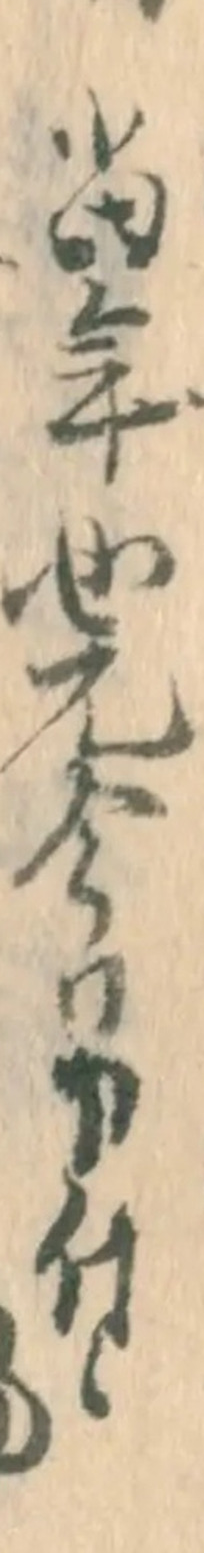当年如元今日申付候事
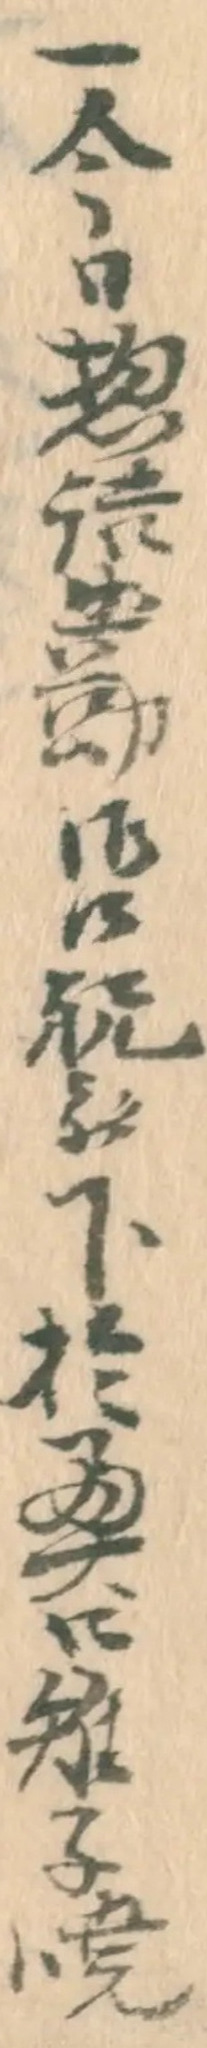一今日惣詰出勤御口祝被下於奥口雉子焼
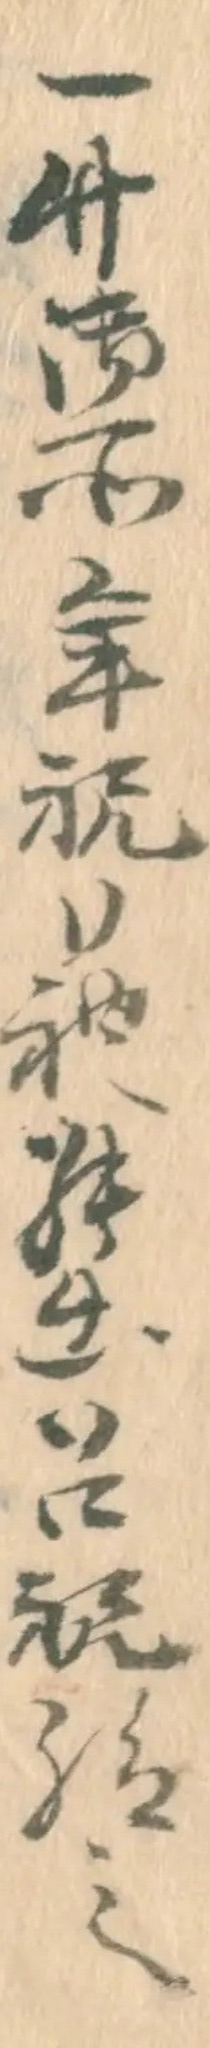一竹御所年祝御礼罷出御口祝給之
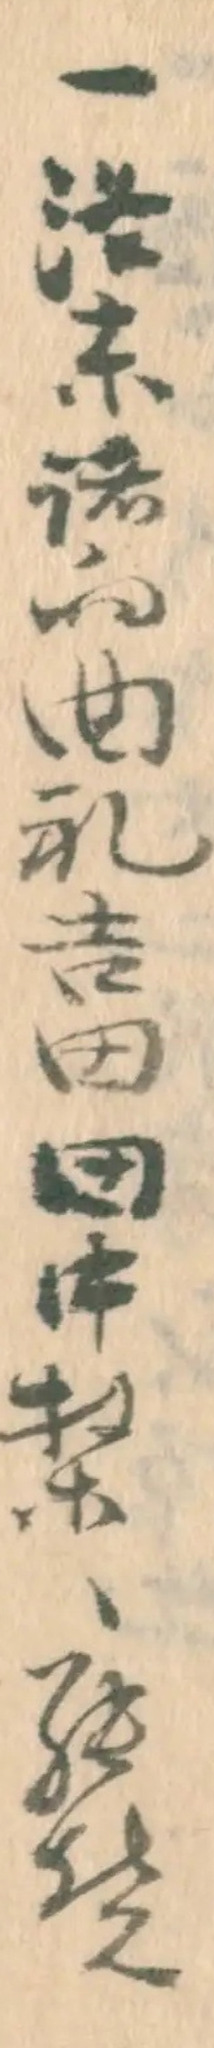一洛東諸向回礼吉田田中牧等へ罷出候
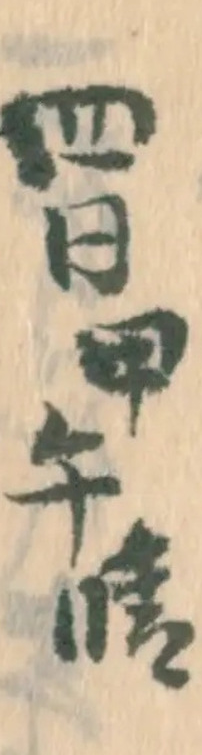四日甲午晴
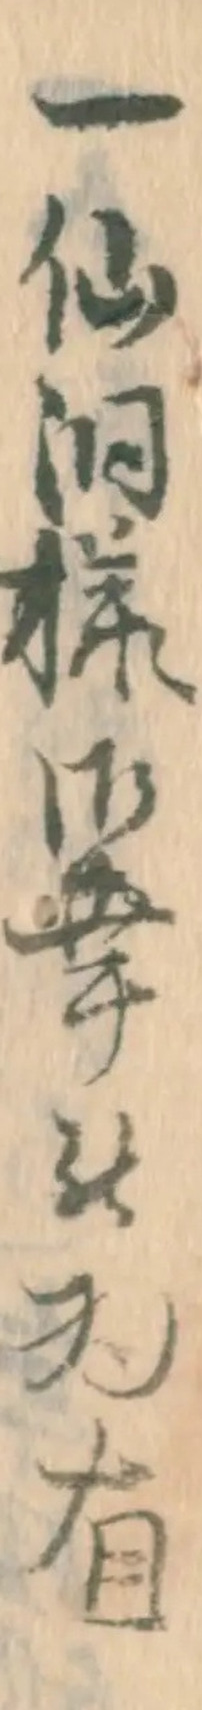一仙洞様御幸被為有
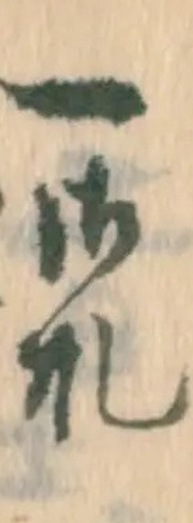一御礼
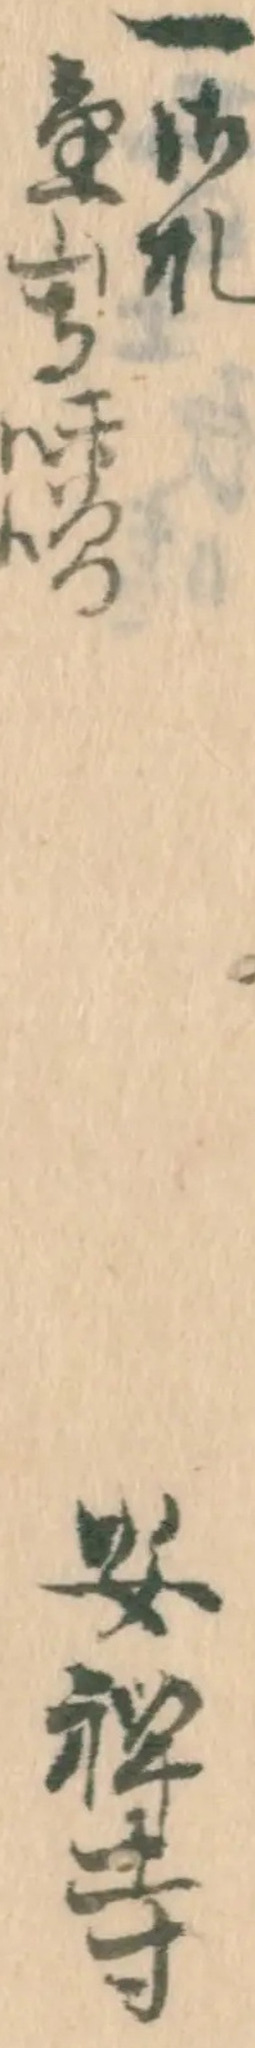金山寺味噌安禅寺
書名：禁裏御所御用日記. [131]
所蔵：国立国会図書館 National Diet Library, JAPAN
